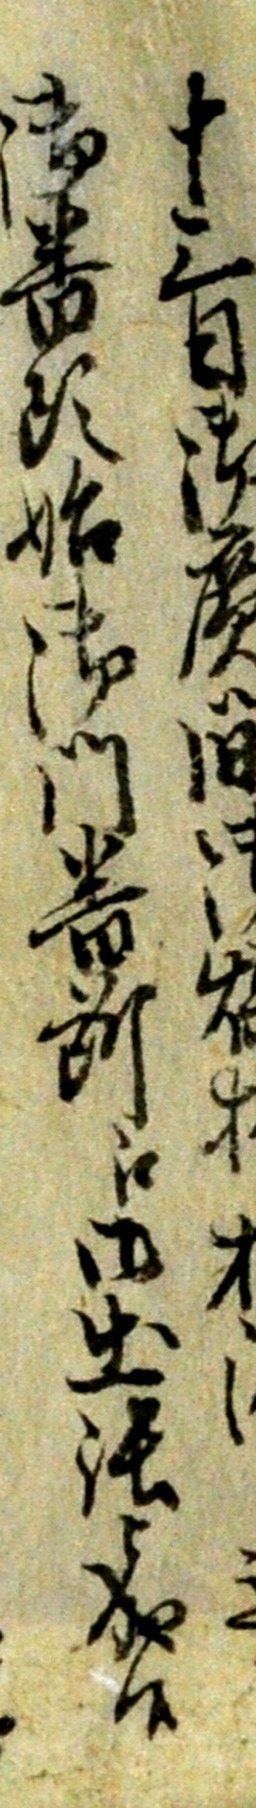御番頭始御門番所江御出張被成候
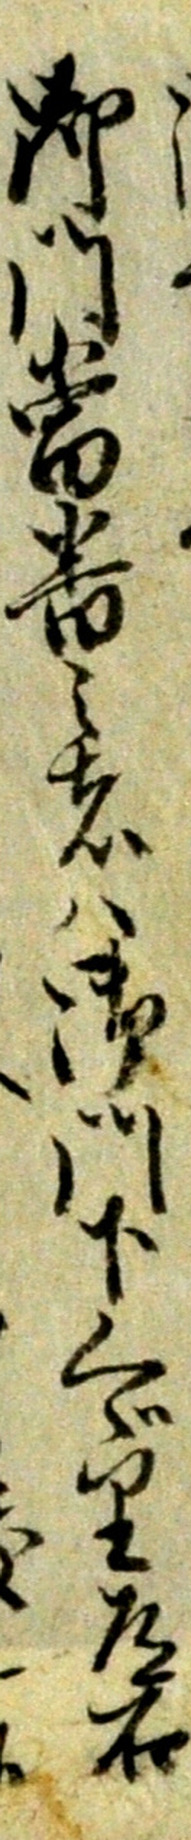御門当番之者ハ御門下くぐり道石
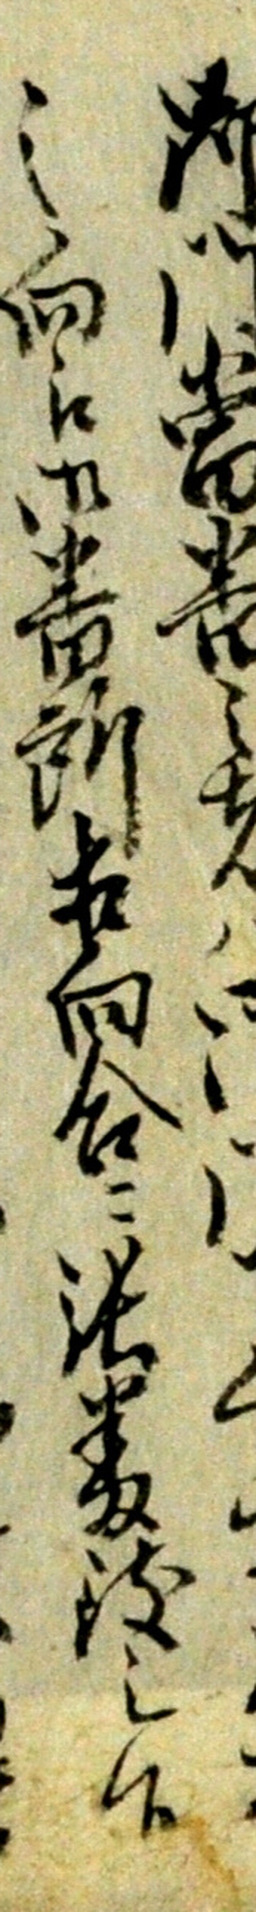之向江御番所相向合ニ張番致シ候
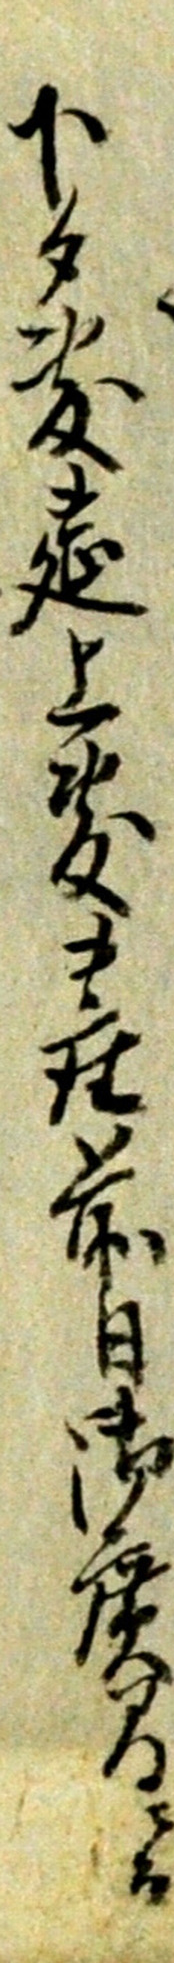下タ敷莚上敷キ座前日御広間ニ而
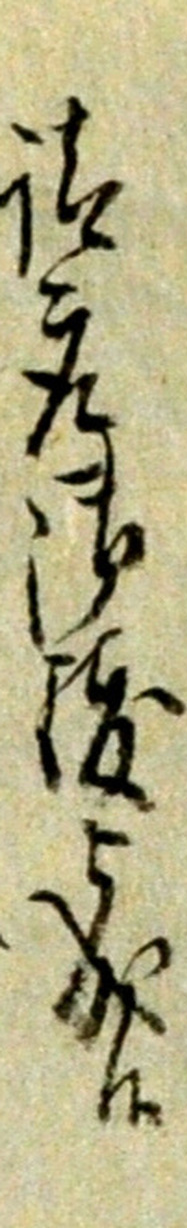請取御渡被成候
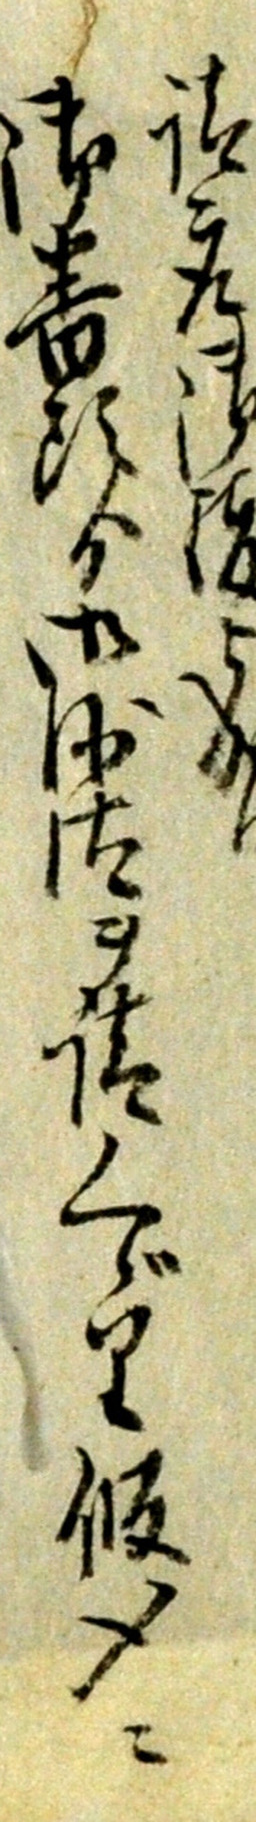御番頭ゟ御沙汰ヲ請くぐり仮〆ニ
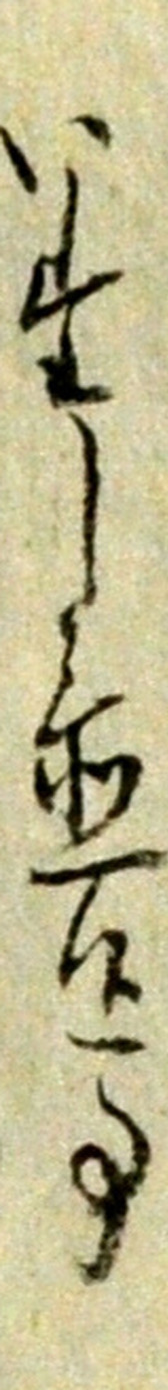いたし置候事
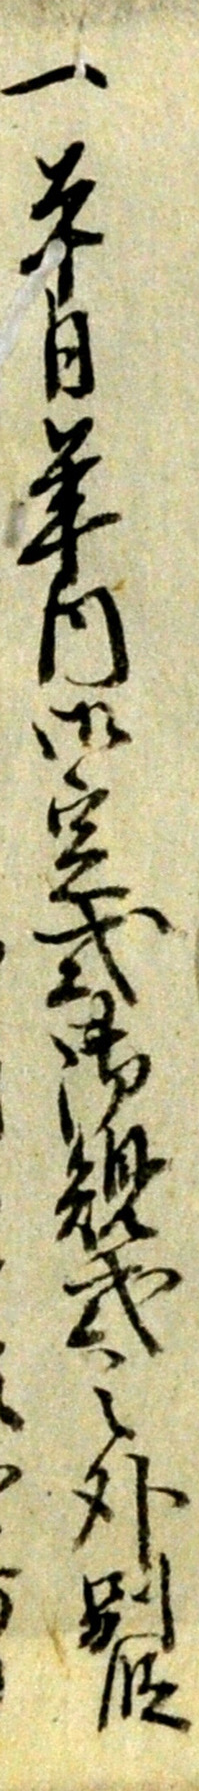一平日年内御定式御規式之外別段
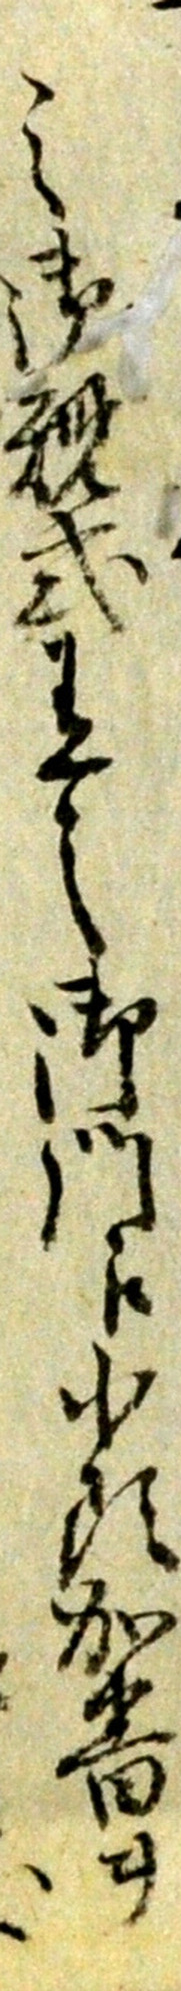之御規式有之御門江小頭加番ヲ
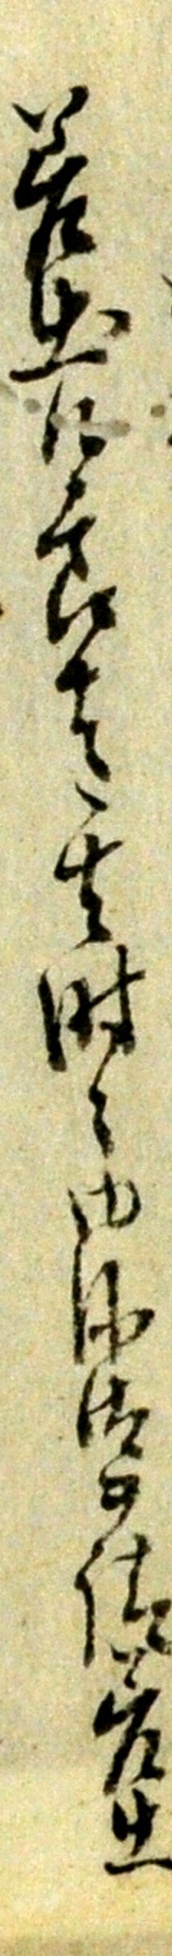差出候節者其時々御沙汰ヲ請差出
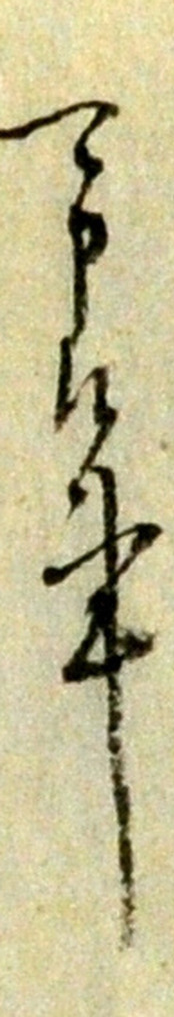可申候事

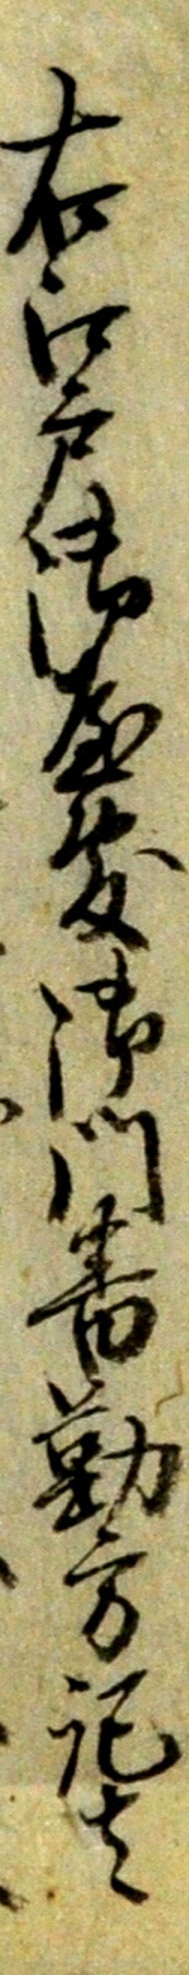右江戸御屋敷御門番勤方記者
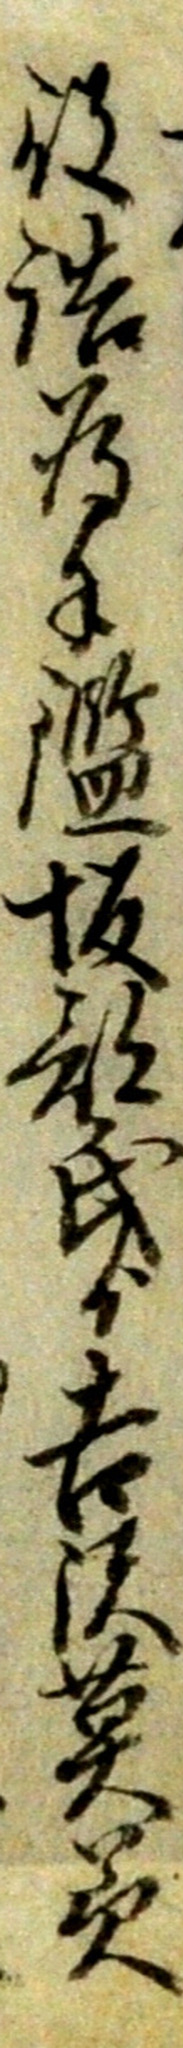役詰為手鑑坂部氏ゟ吉沢莫美
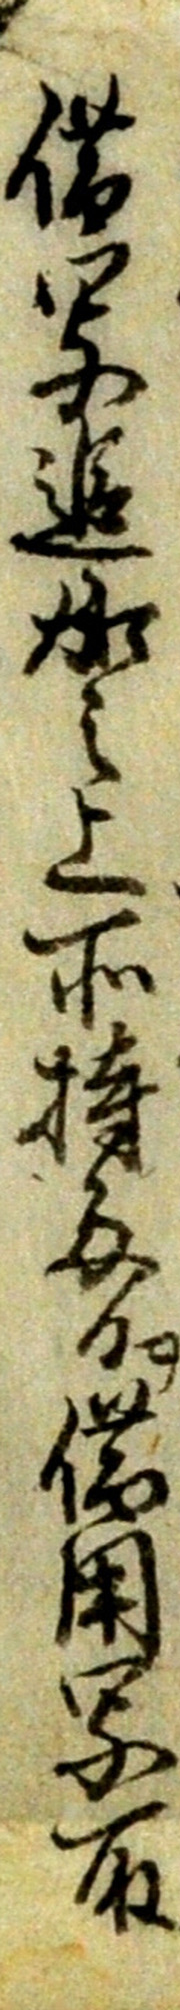借写追加之上所持両日ヲ借用写取
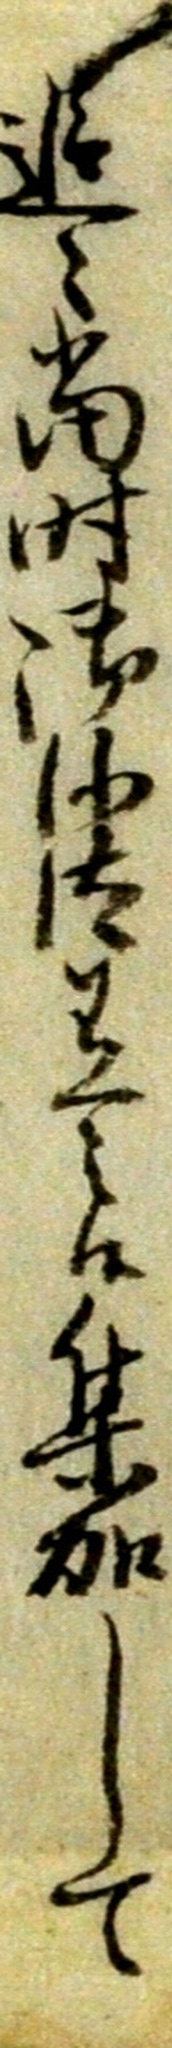追々当時御沙汰有之候集加して
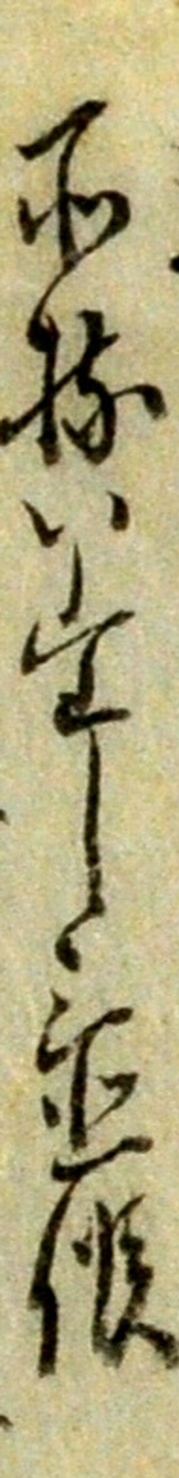所持いたし置候
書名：御先手組江戸御屋敷御門番勤方
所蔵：伊那市立高遠町図書館・合同会社AMANE
